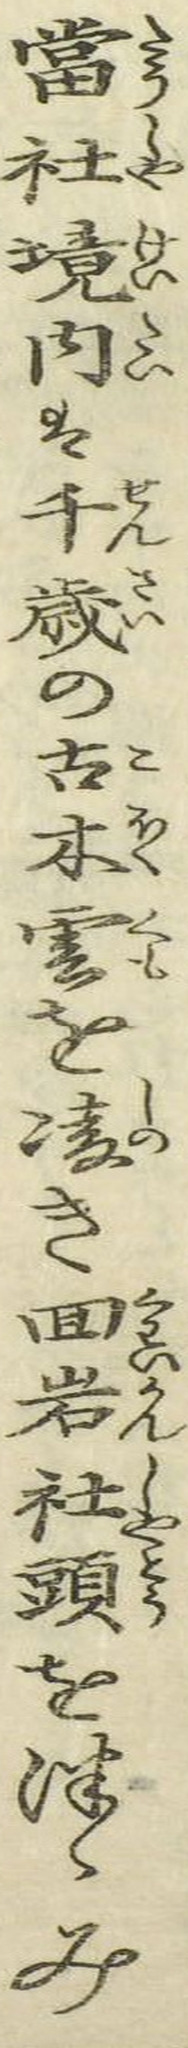當社境内は千歳の古木雲を凌き囬岩社頭をつゝみ
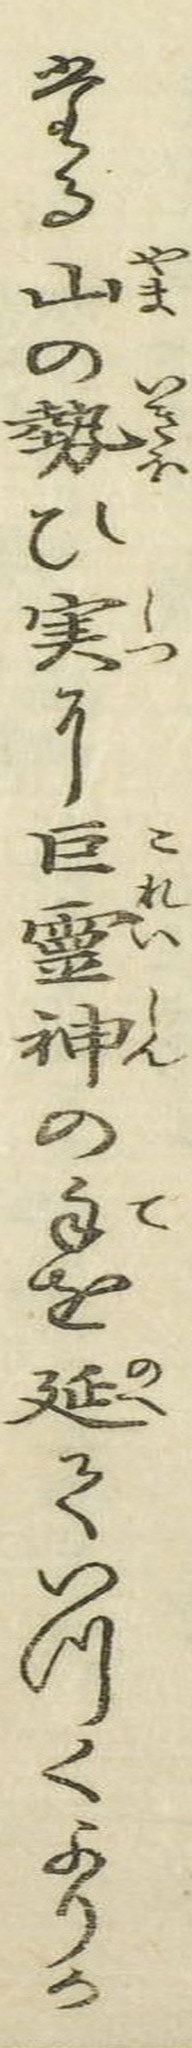たる山の勢ひ実に巨靈神の手を延ていつくよりか
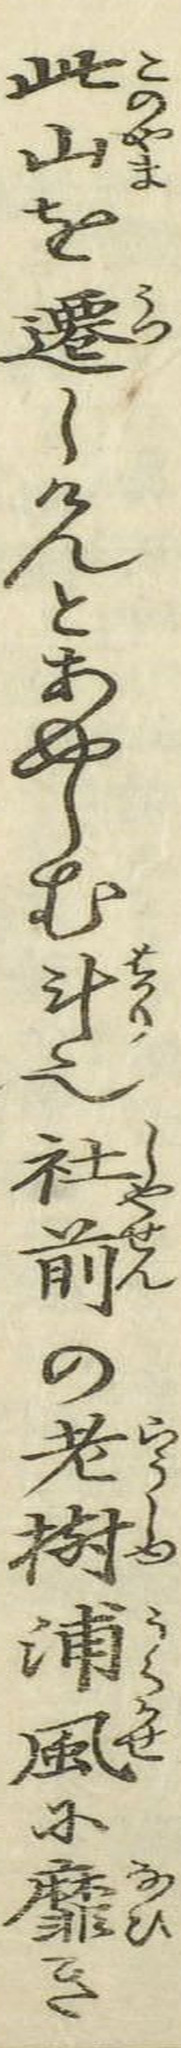此山を遷しけんとあやしむ斗也社前の老樹浦風に靡き
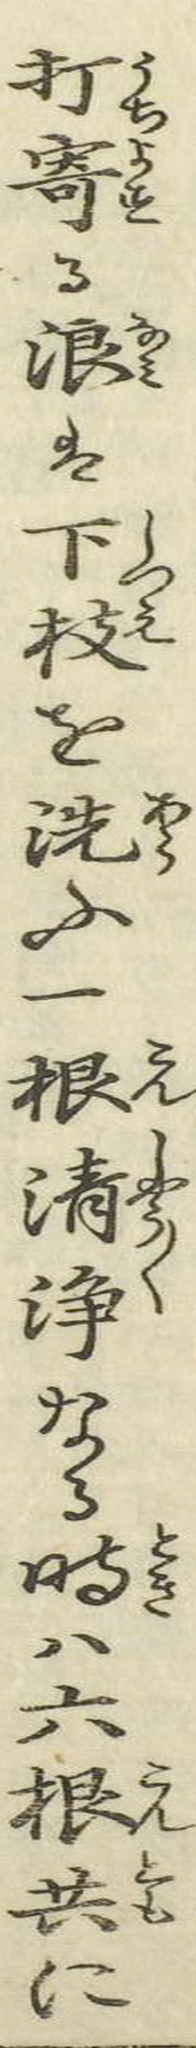打寄る浪は下枝を洗ふ一根清浄なる時は六根共に
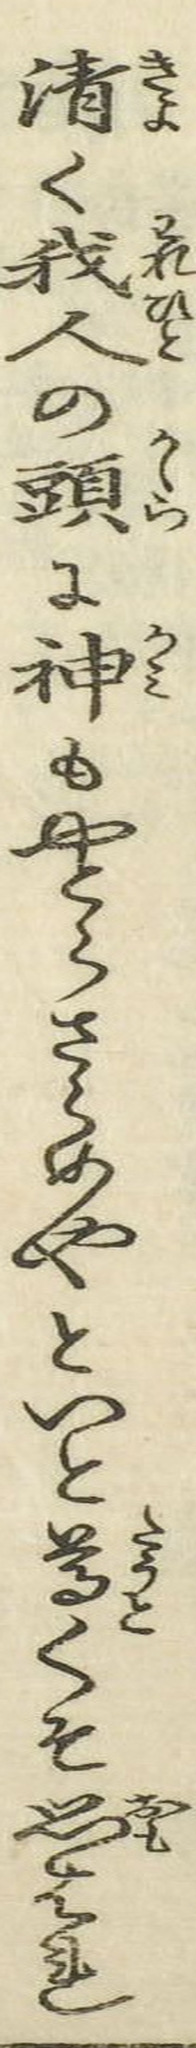清く我人の頭に神もやとらさらめやといと尊くそ思はれ
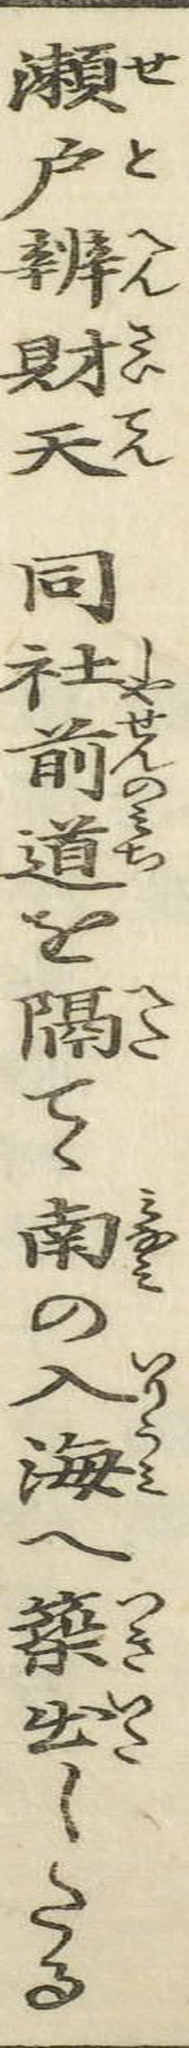瀬戸辨財天同社前道を隔てゝ南の入海へ築出したる
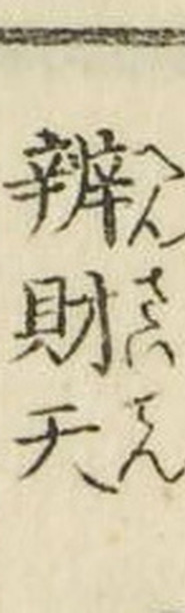辨財天

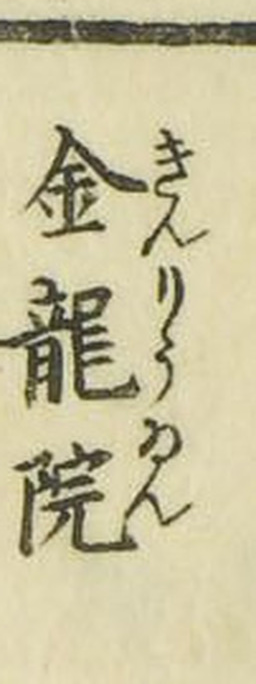金龍院

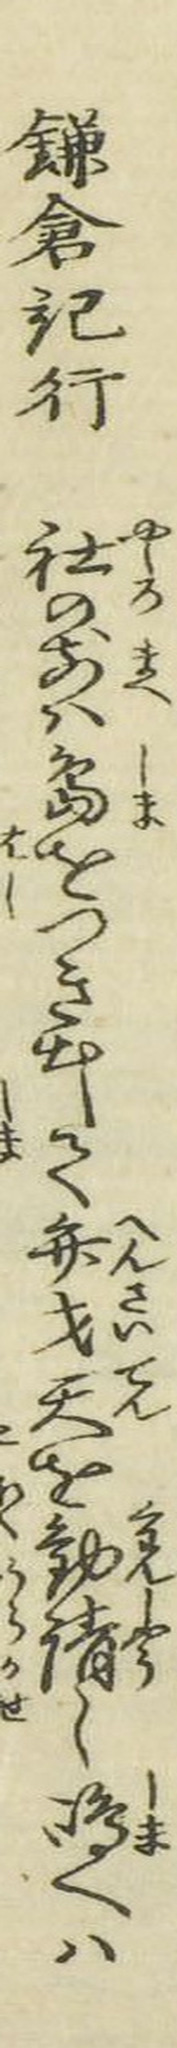鎌倉記行社の前は島をつき出して弁才天を勧請し嶋へは
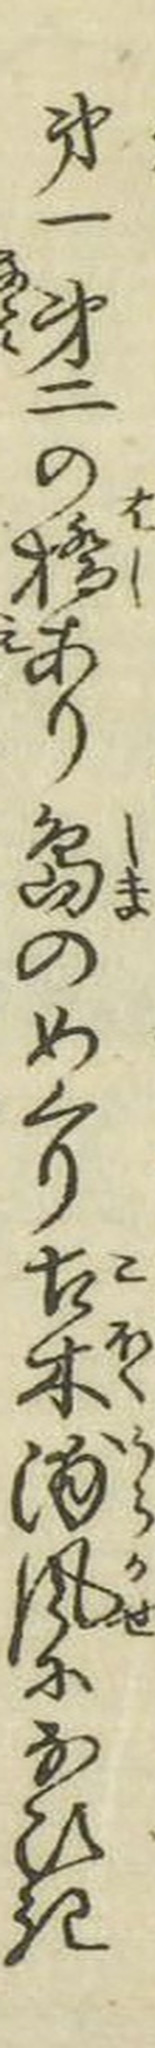㐧一㐧二の橋あり島のめくり古木浦風になひき
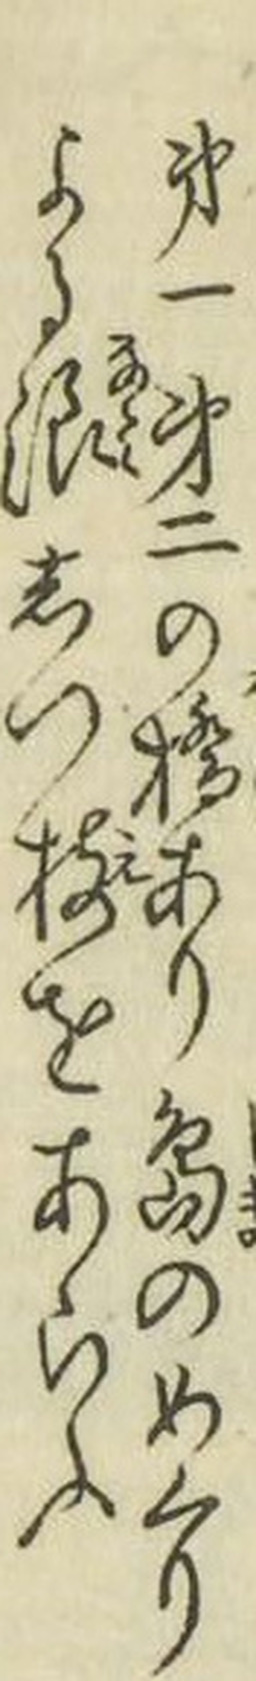よる浪しつ枝をあらふ
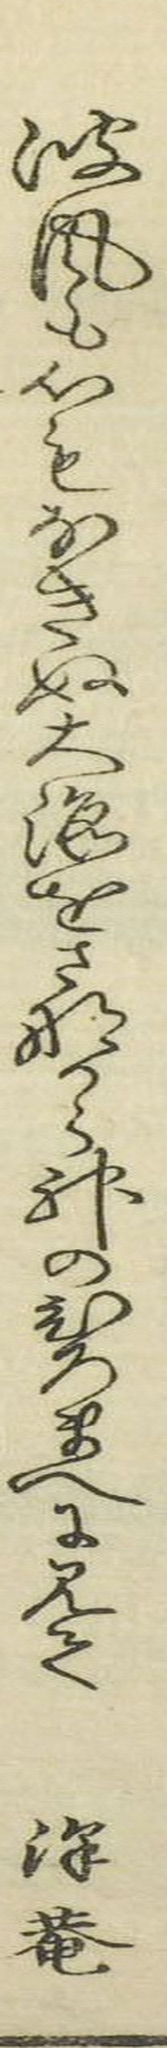波風も心もなきぬ大海をさなから神のひろまへに見て澤菴
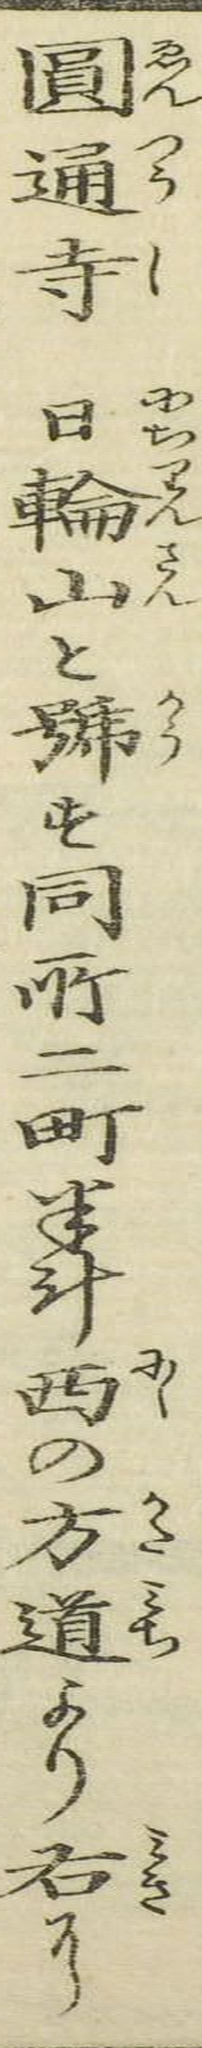圓通寺日輪山と號す同所二町半斗西の方道より右に
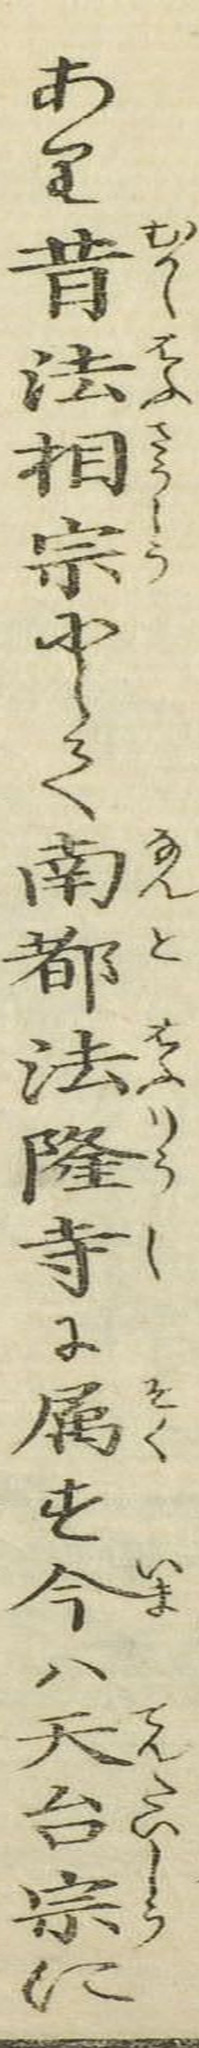あり昔法相宗にして南都法隆寺に属す今は天台宗に
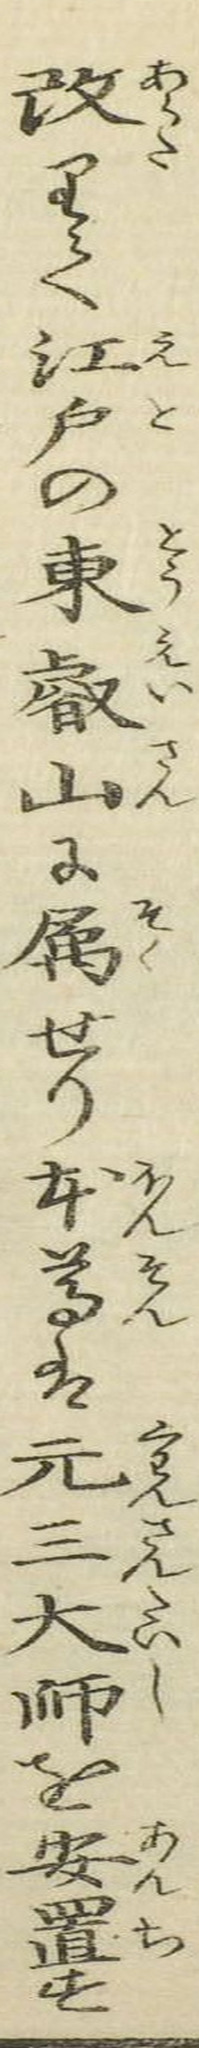改りて江戸の東叡山に属せり本尊は元三大師を安置す
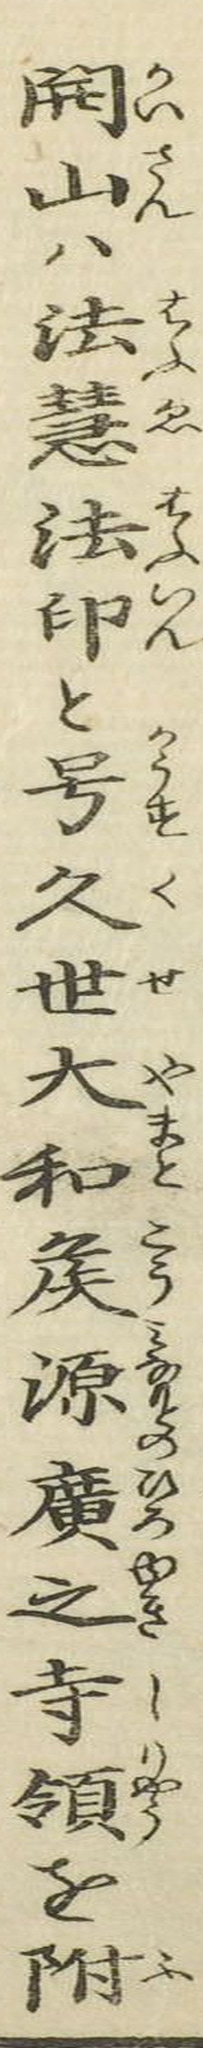開山は法慧法印と号久世大和矦源廣之寺領を附
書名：江戸名所図会 20巻 巻之6
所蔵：東京学芸大学教育コンテンツアーカイブ
